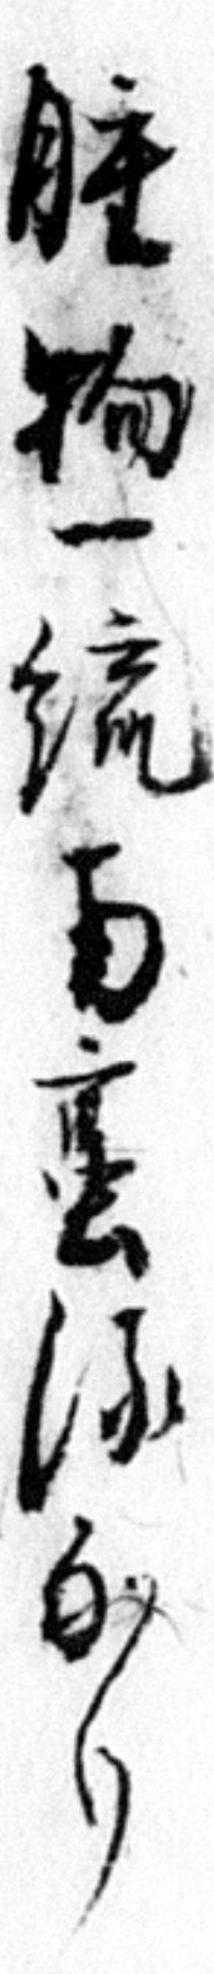腫物一統南蛮流なり
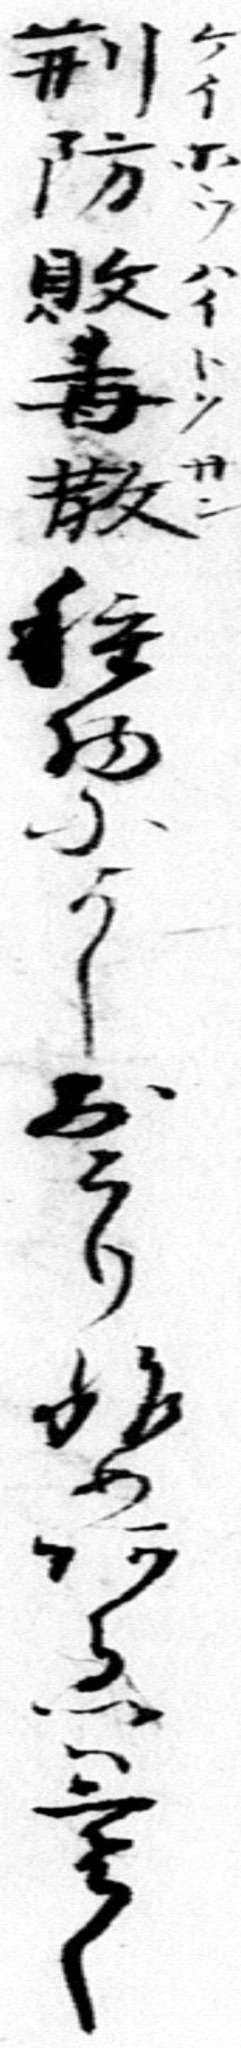荊防敗毒散腫物によしおこり始めあるいは寒く
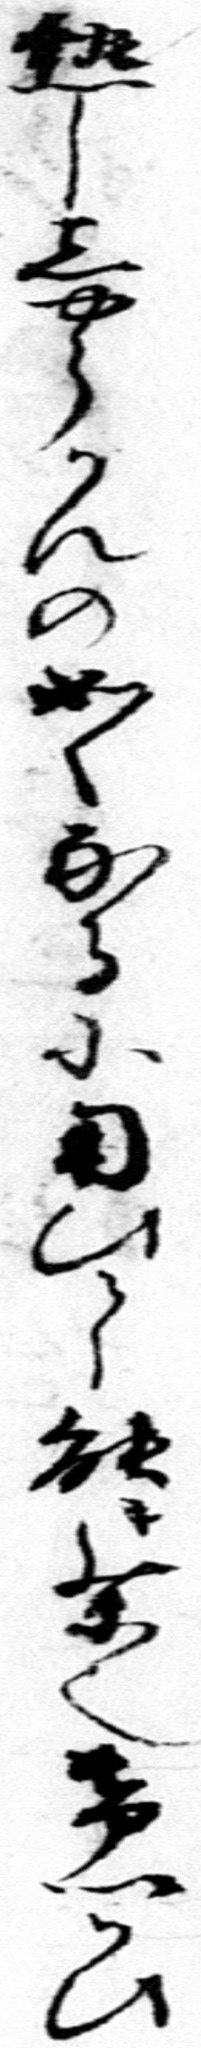熱ししやうかんの如くなるに用ひて能き薬也けいかひ
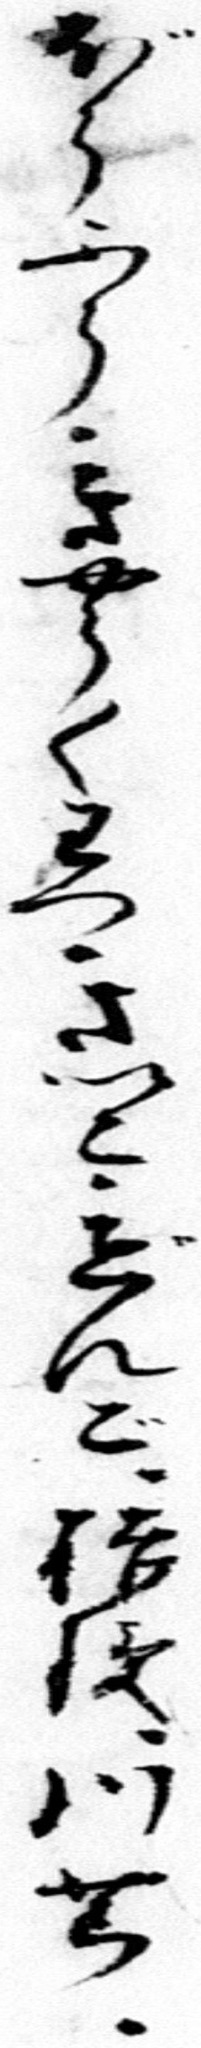ぼうふう・きやうくわつ・さいこ・ぜんご・桔梗・川芎
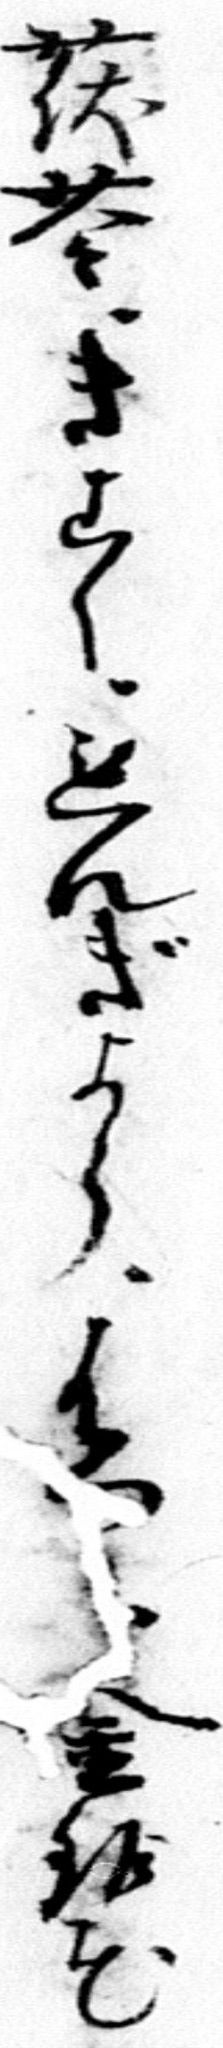茯苓・きこく・れんぎよう・金銀花
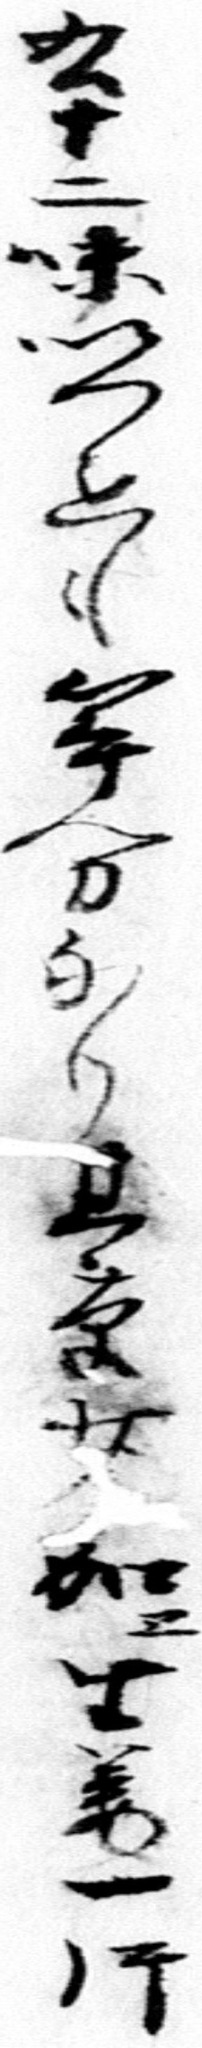右十二味いつれも等分なり甘草少加ゑ生姜一片
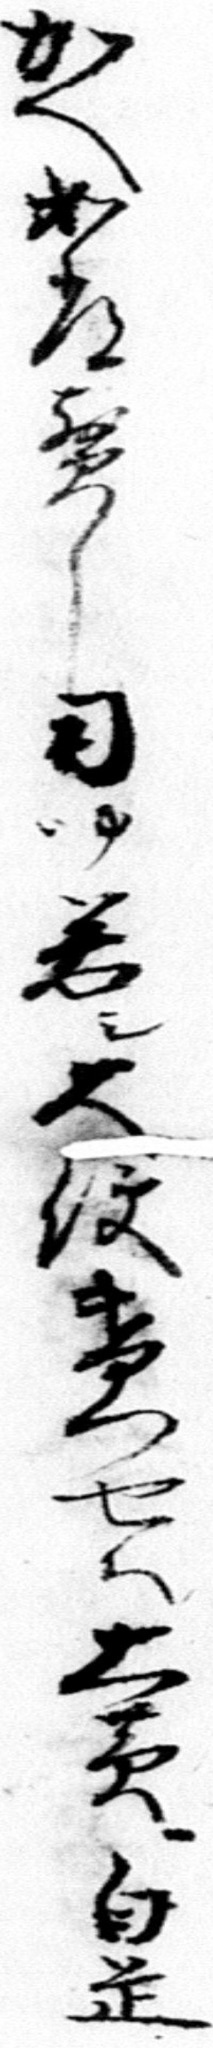加へ如常煎し用ゆ若し大便つせは大黄・白芷
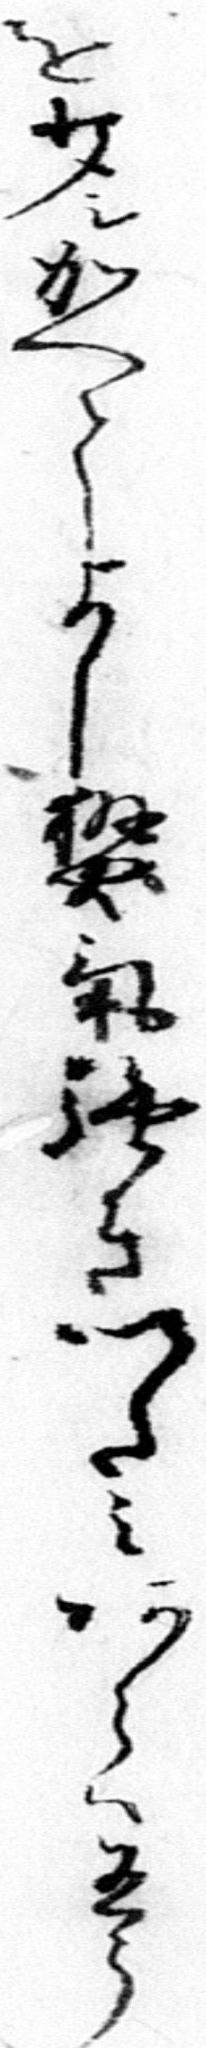を少し加へてよし熱気強きいたみあらはわう
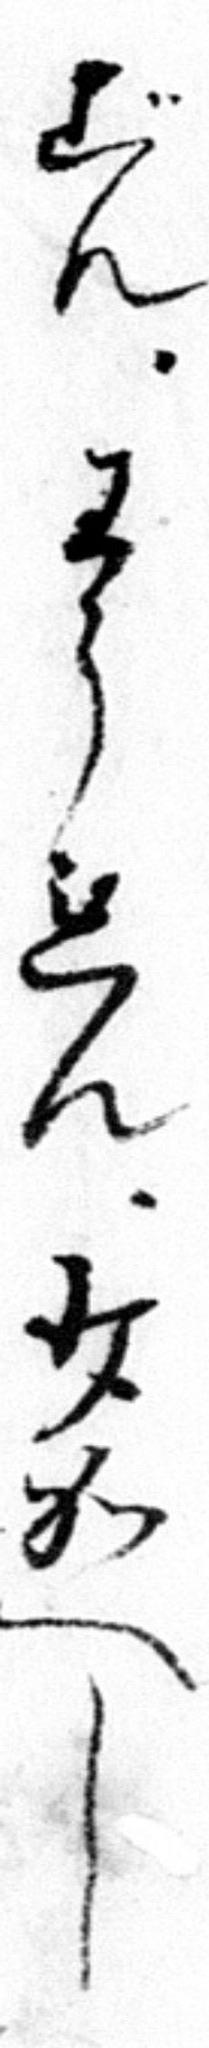ごん・わうれん・少加へし
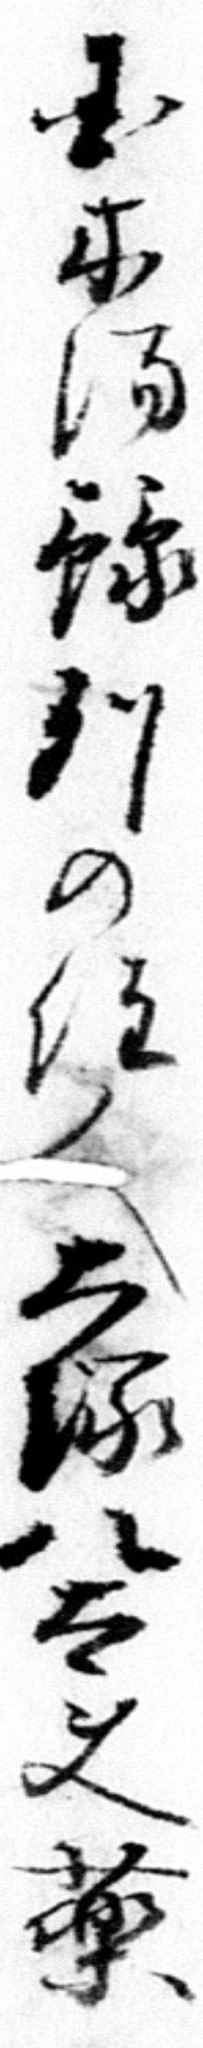国木湯予州の住人大塚八大夫薬
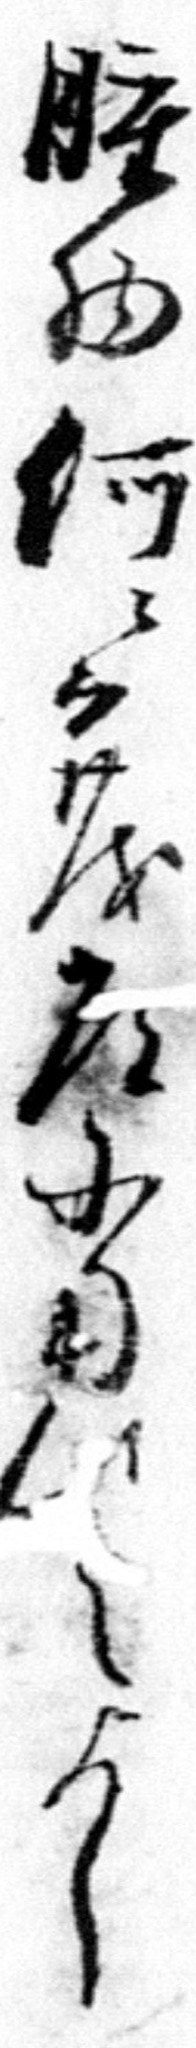腫物何にても常に用ひてよし
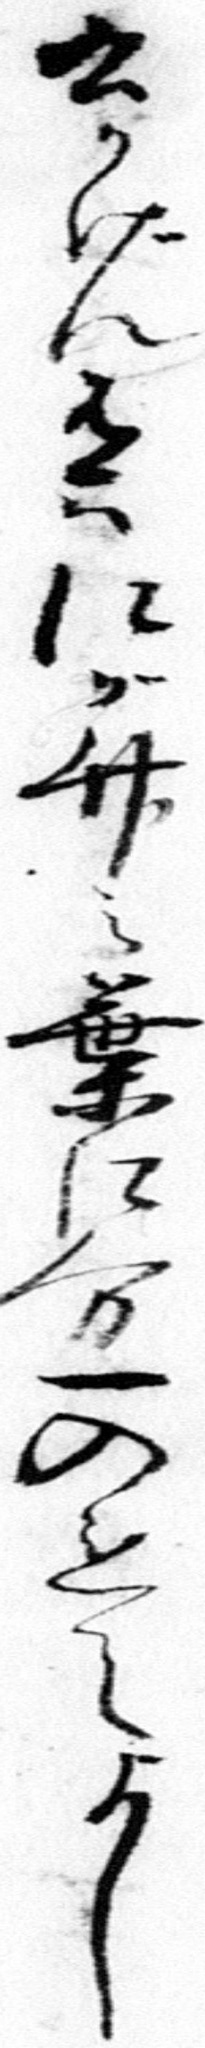右かげん有はにが竹の葉四分の一入れてよし
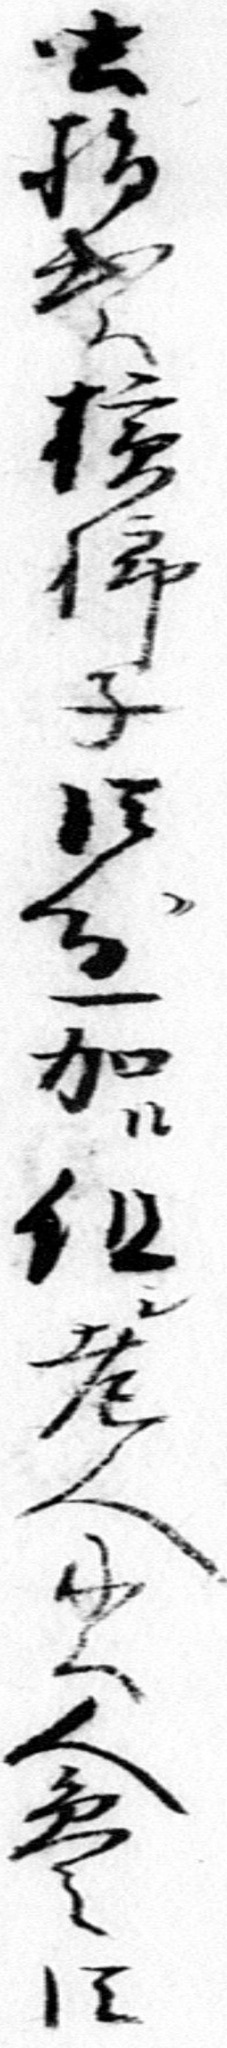虫指出は檳榔子四分一加る但し老人には人参四
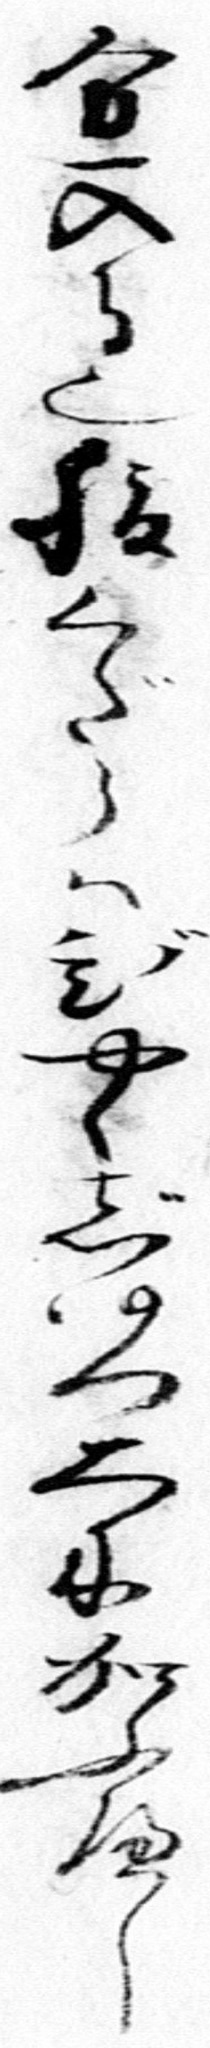分一入る也腹くだらはびやくじゆつ大に加ふへし
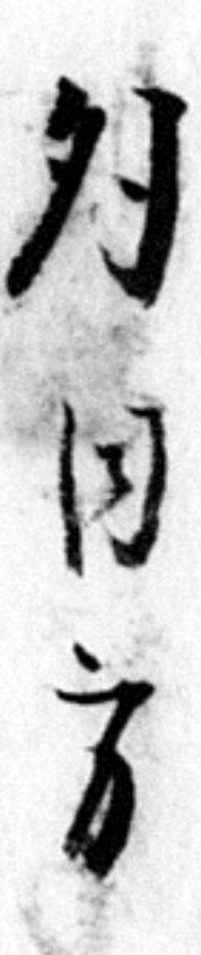外同方
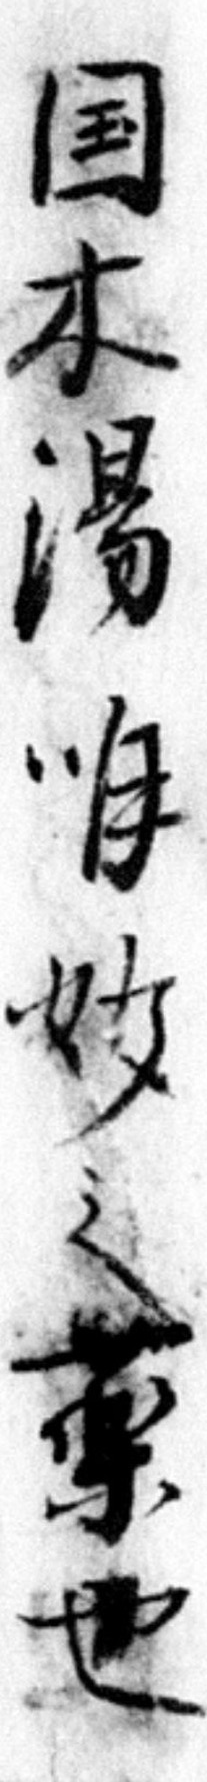国木湯明妙之薬也
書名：名薬秘伝之書
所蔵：徳島県立図書館
